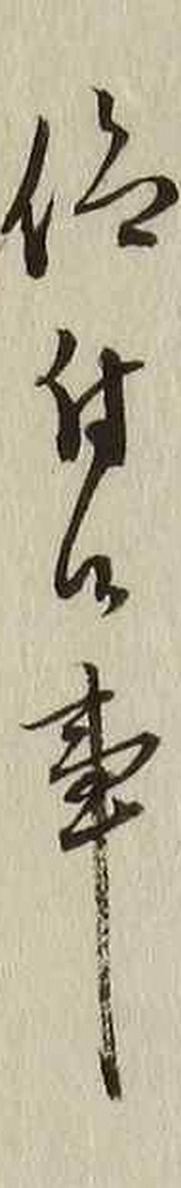仰付候事
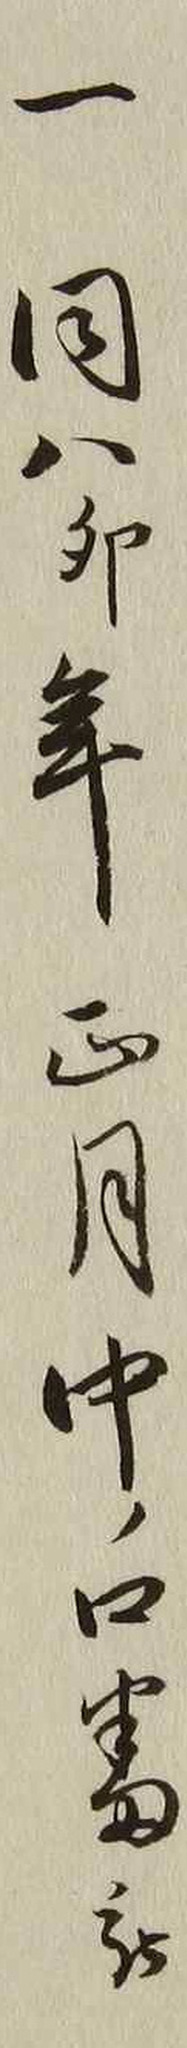一同八卯年正月中ノ口番被
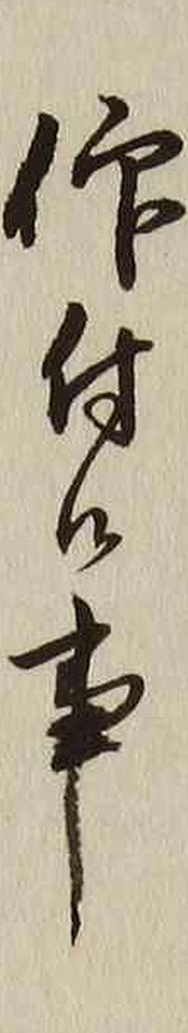仰付候事
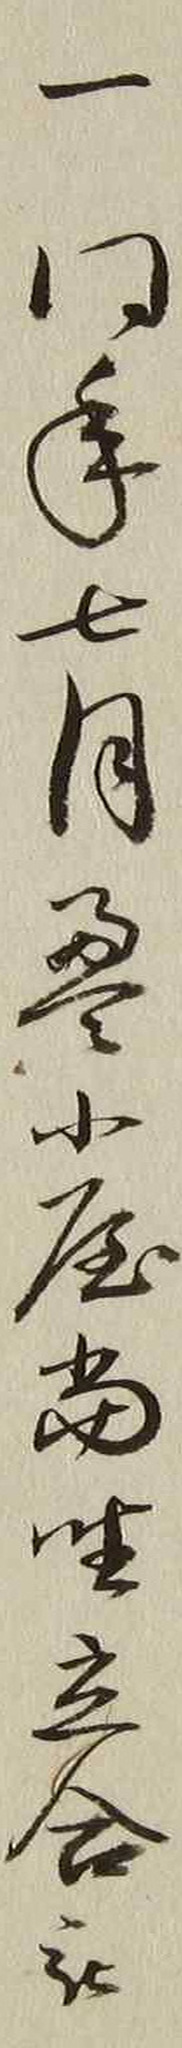一同年七月畳小屋当坐立合被
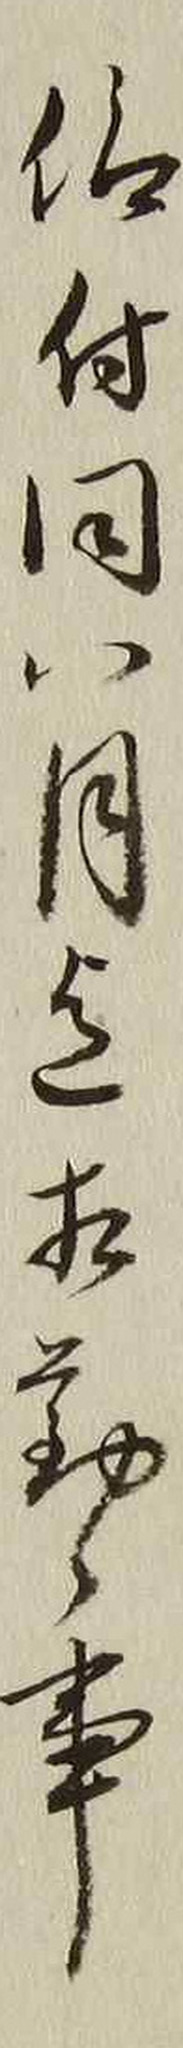仰付同八月迄相勤候事
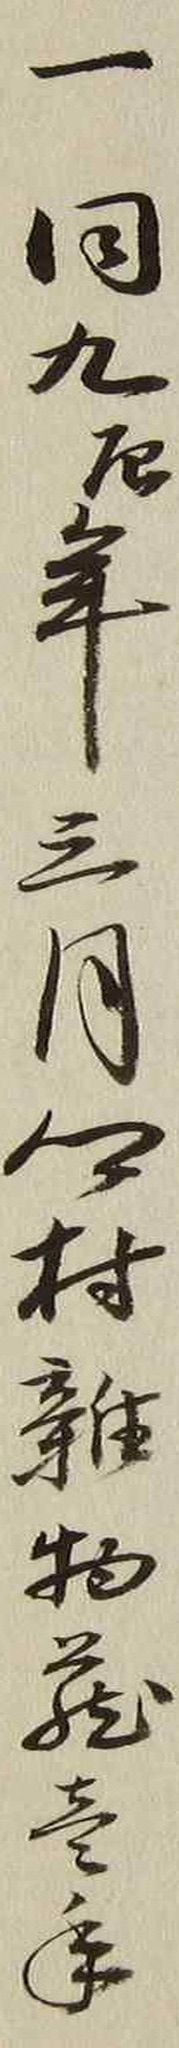一同九辰年三月郷村雑物蔵壱年
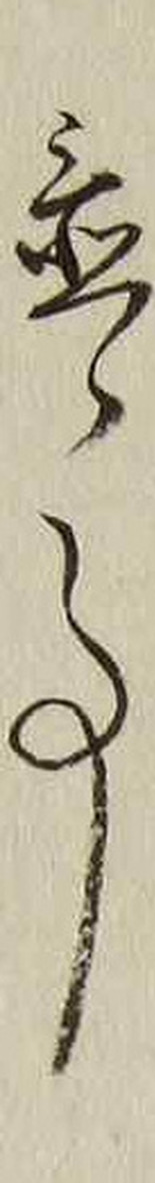置候事
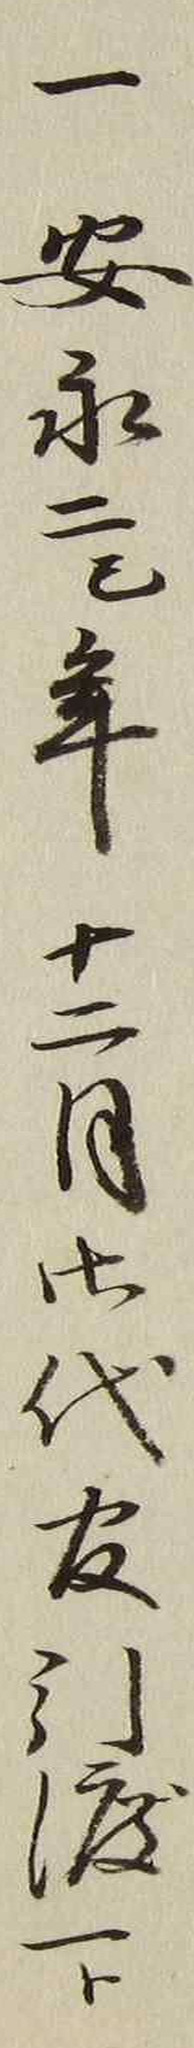一安永二巳年十二月御代官引渡一ト
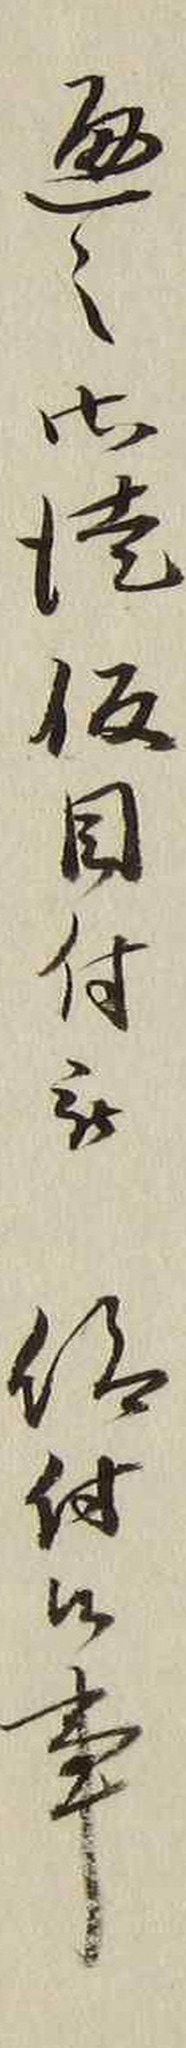通之御徒仮目付被仰付候事
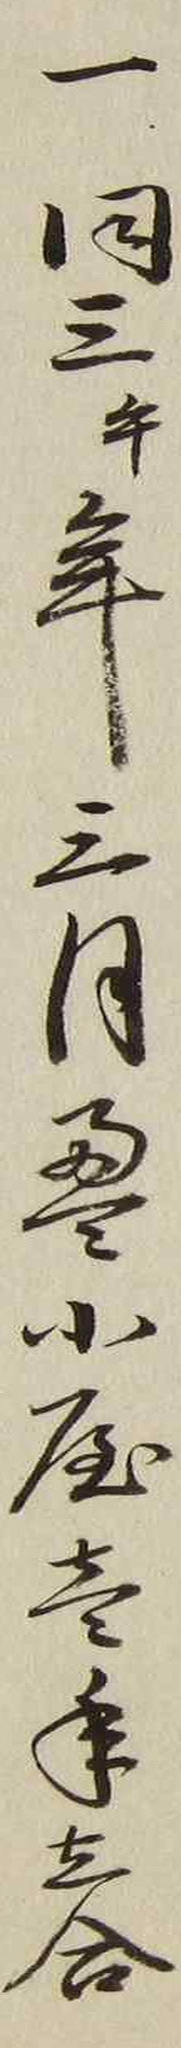一同三午年三月畳小屋壱年立合

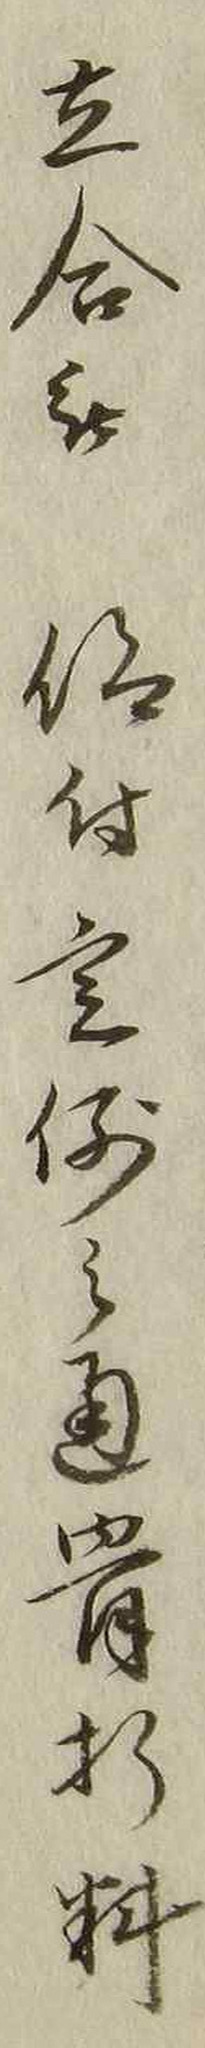立合被仰付定例之通骨折料
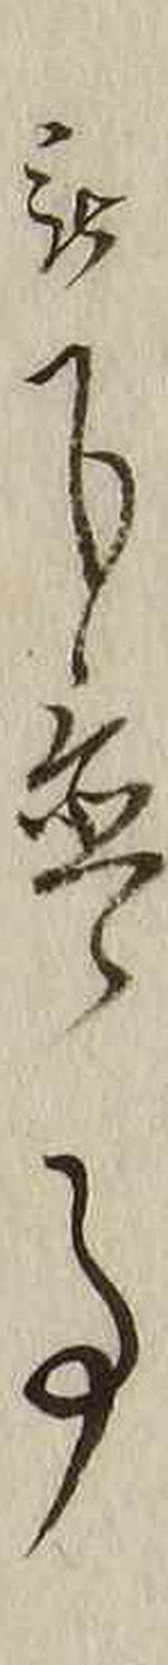被下置候事
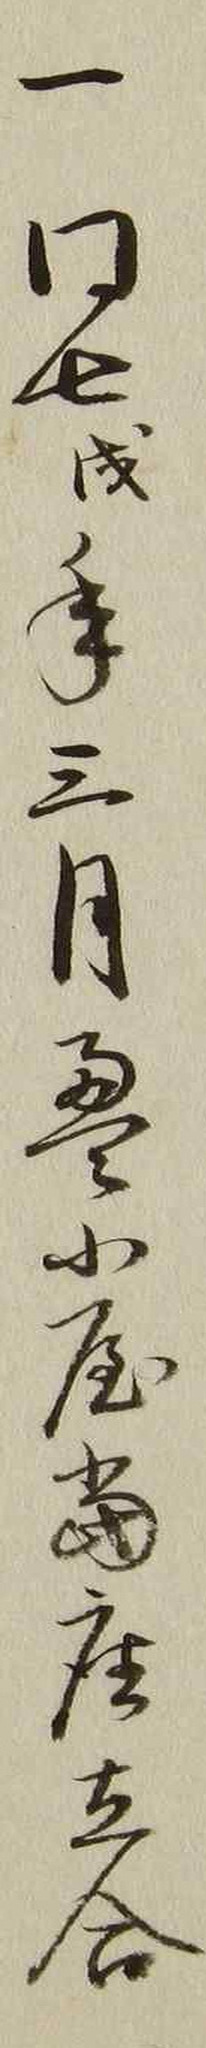一同七戌年三月畳小屋当座立合
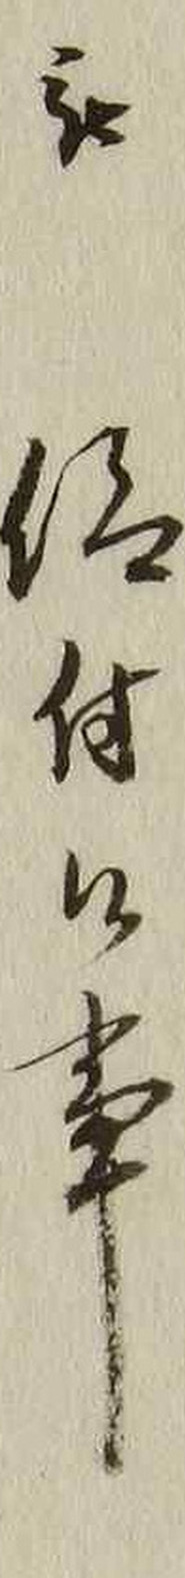被仰付候事
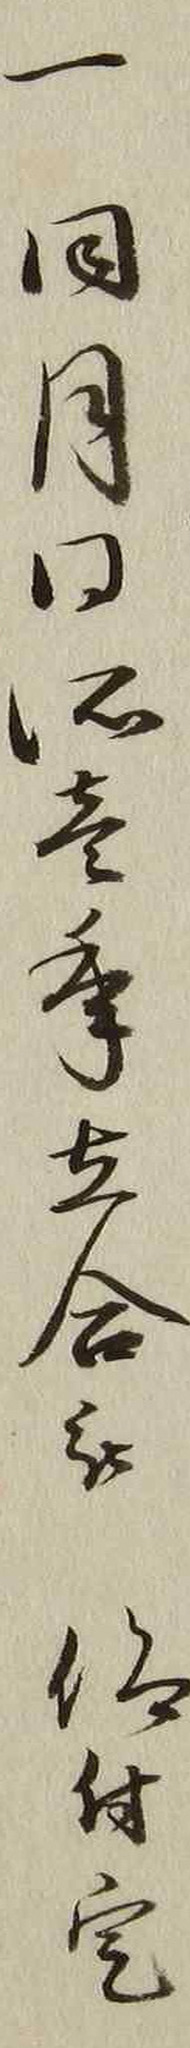一同月同所壱手立合被仰付定
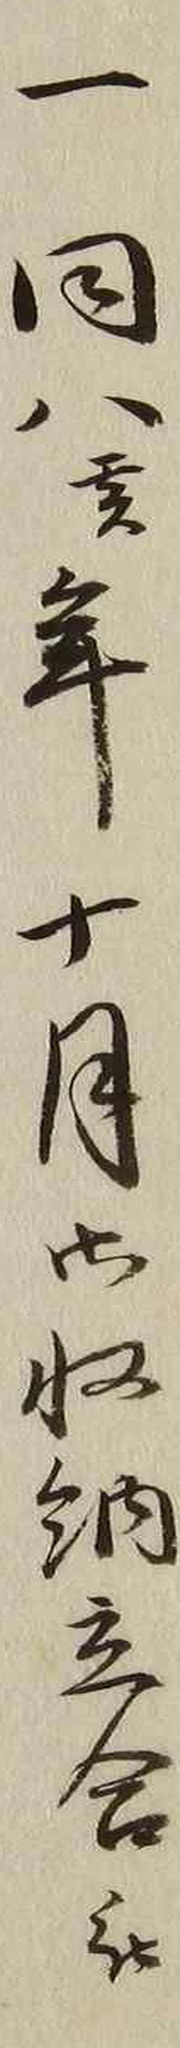一同八亥年十月御収納立合被
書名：諸士系譜　巻之102　か之部10
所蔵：会津若松市立会津図書館
